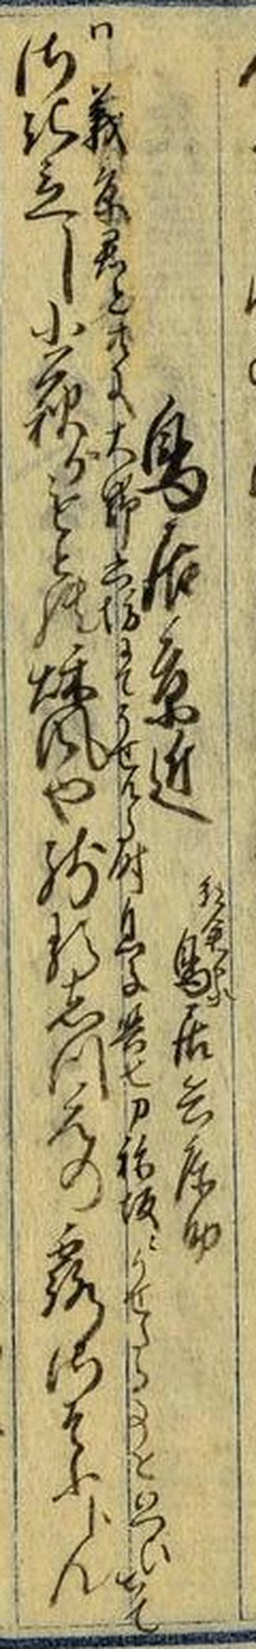同義景君と共に大野六坊にてうせんる時息子與七刀祢坂ニうせたる事を思い出て
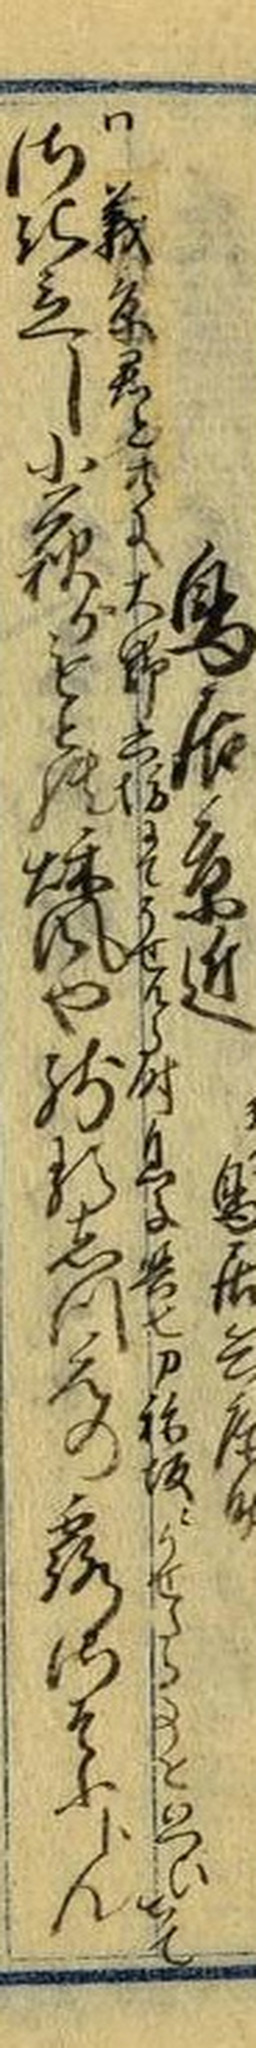さき立し小萩がもとの秋風や残るしつえの露さそふらん
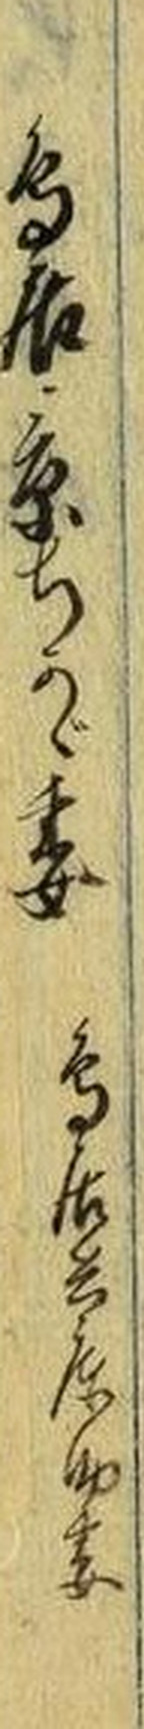鳥居景ちかゞ妻鳥居兵庫助妻
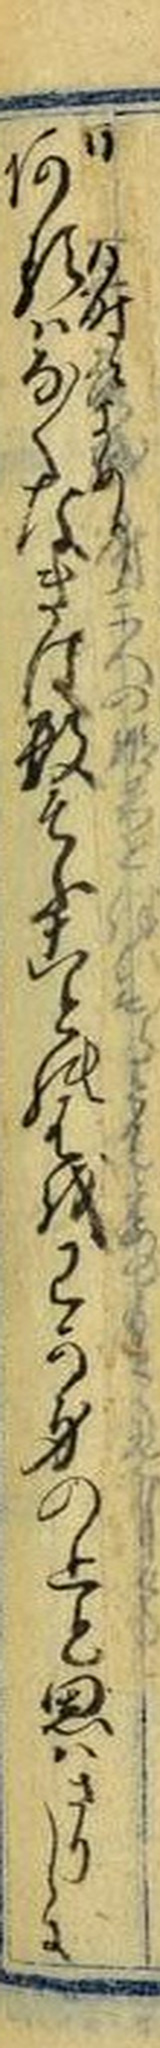あるはなくなきは散そふことのはをわか身の上と思はさりはさりしに
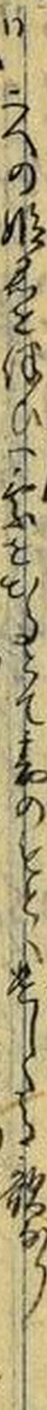同二人の姫君を伴ひ一乗を出るとて妻のもとへ遣したる歌なり
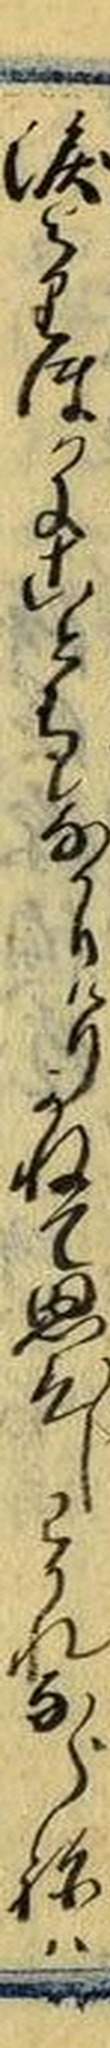涙よりほかにことはもなかりけりかねて思ひしわかれならねは
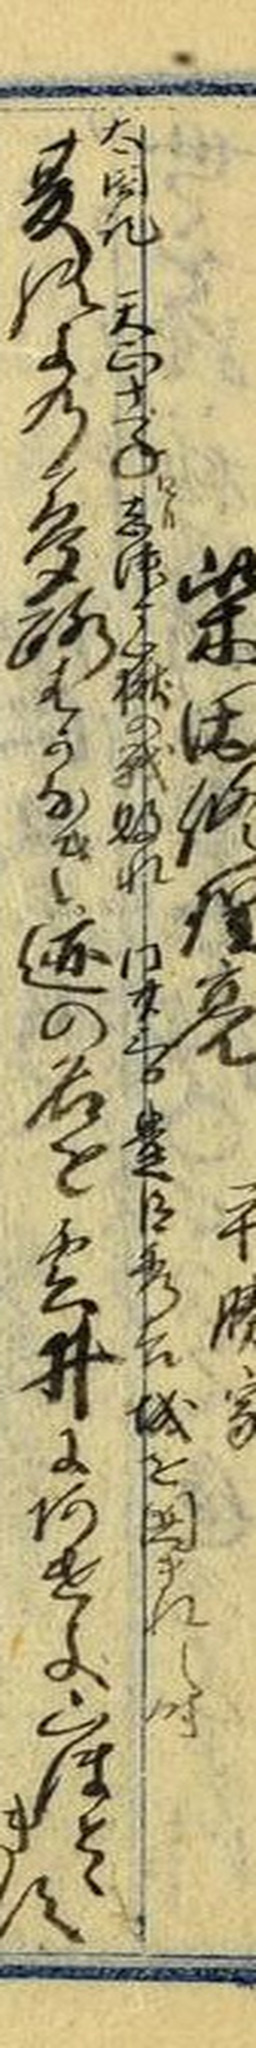夏のよの夢路はかなき跡の名を雲井にあけよ山ほとときす
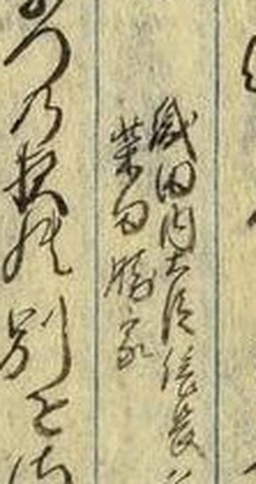柴田勝家
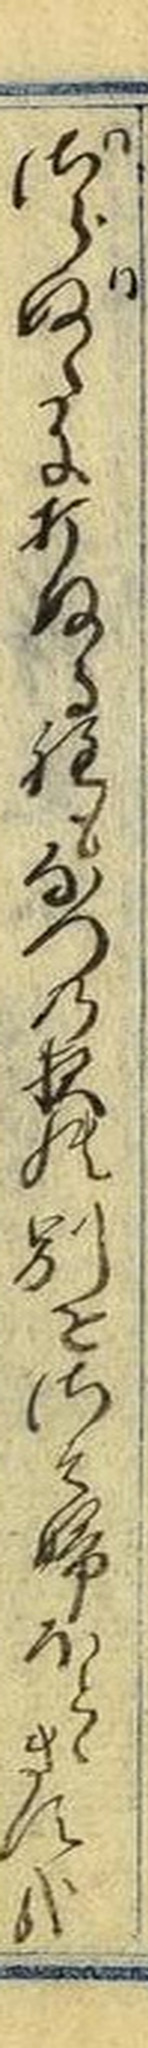さらぬたに打ぬる程もなつの夜の別をさそふほとときす哉
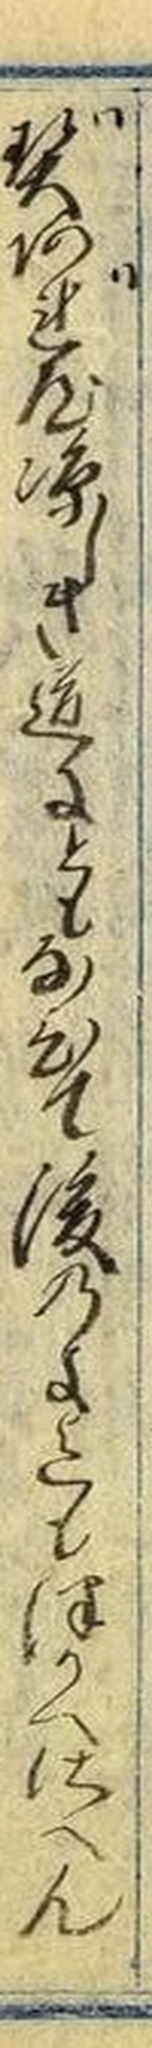契あれや涼しき道にともなひて後のよ迄もつかへ仕へん
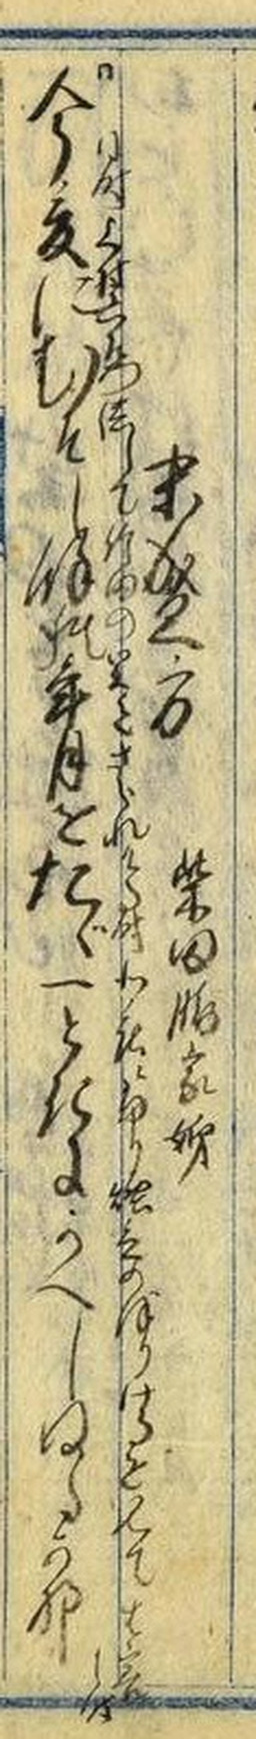同同時植村六左衛門供して竹田の里迄さられける時北ノ庄ニ當り煙立のぼりけるを見て生害之時
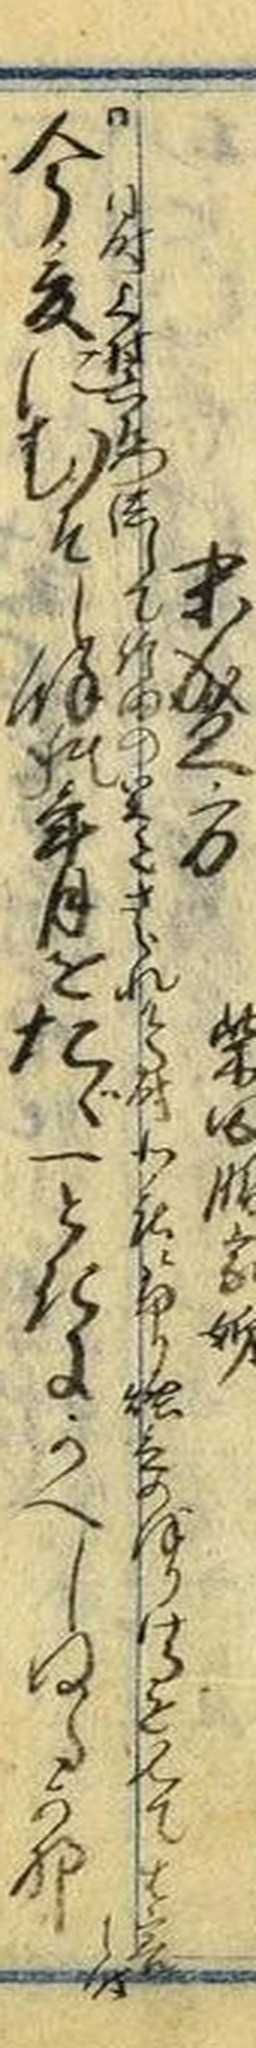今爰にむそし餘の年月をたゞ一ときにかへしつるかな

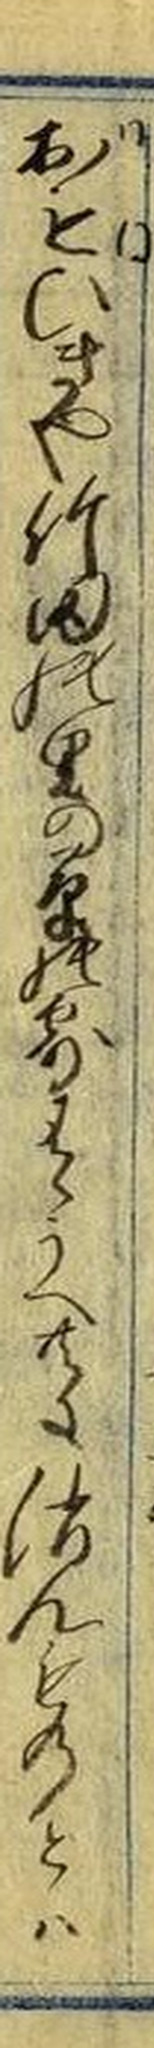おもひきや竹田の里の原の寄はゝうえ共に消んものとは
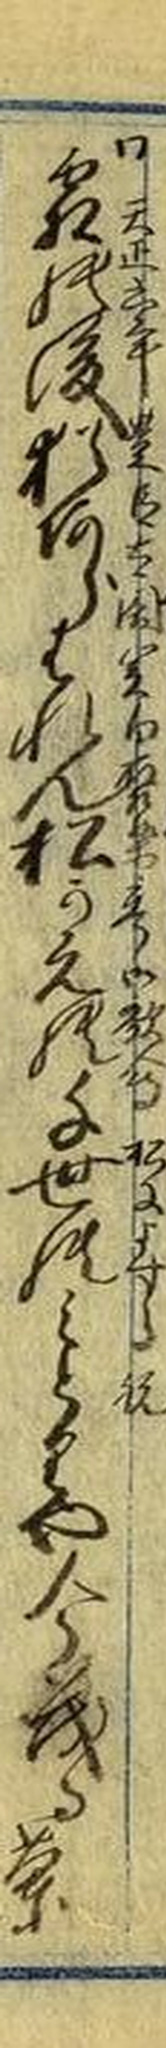露の後猶あらはれん松かえの千世のみとりや今茂る葉
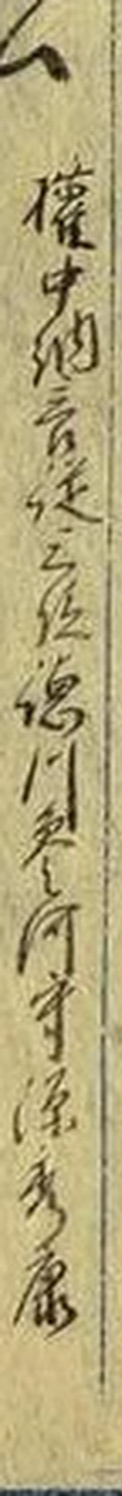浄光公權中納言従三位徳川參河守源秀康
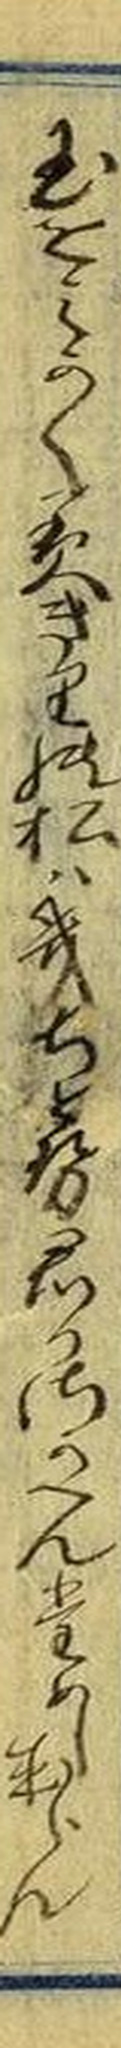玉をみかく美き里の松は幾ちとせ君かさかへんためし成らん
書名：温古集 三巻
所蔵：福井県文書館 Fukui Prefectural Archives
